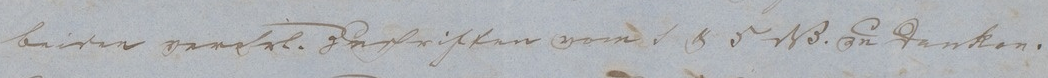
beiden verehrl. Zuschriften vom 1 & 5 dß. zu danken.
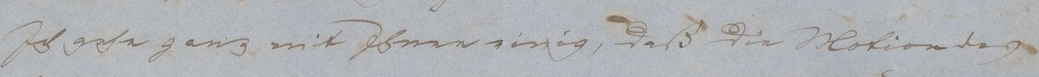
Ich gehe ganz mit Ihnen einig, daß die Motion des
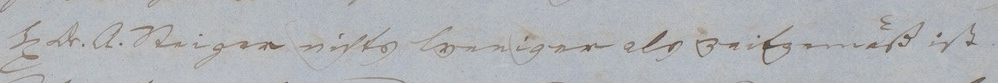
Hrn Dr. A. Steiger nichts weniger als zeitgemäß ist.
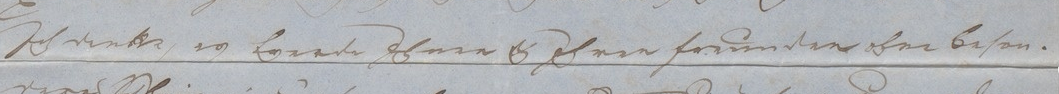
Ich denke, es werde Ihnen & Ihren Freunden ohne beson-
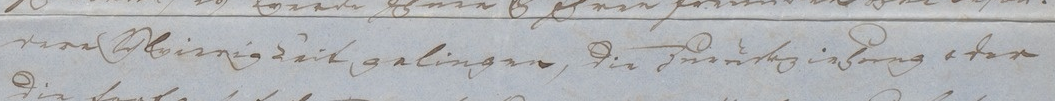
dere Schwierigkeit gelingen, die Zurückziehung oder
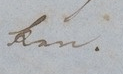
ken.
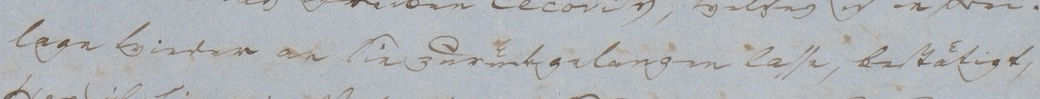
lage wieder an Sie zurückgelangen lasse, bestätigt,
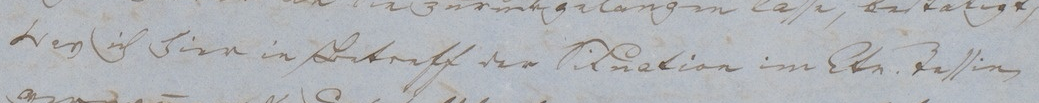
was ich hier in Betreff der Situation im Ctn. Tessin
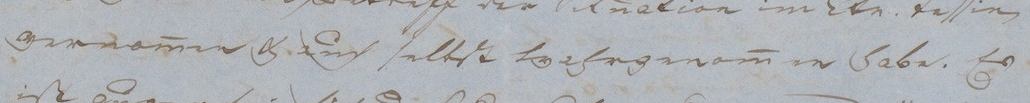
vernommen & auch selbst wahrgenommen habe. Es
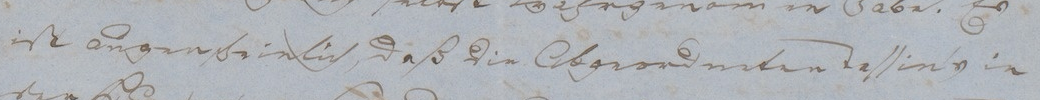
ist augenscheinlich, daß die Abgeordneten Tessin's in
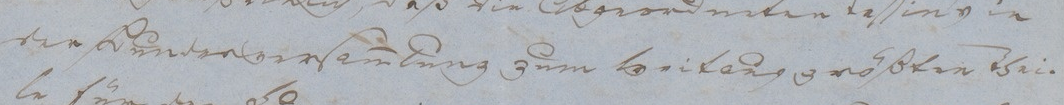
der Bundesversammlung zum weitaus größten Thei-
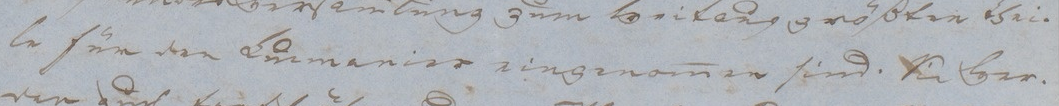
le für den Lucmanier eingenommen sind. Sie wer-
